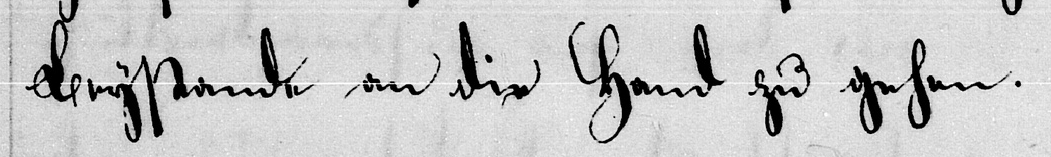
Beystande an die Hand zu gehen.
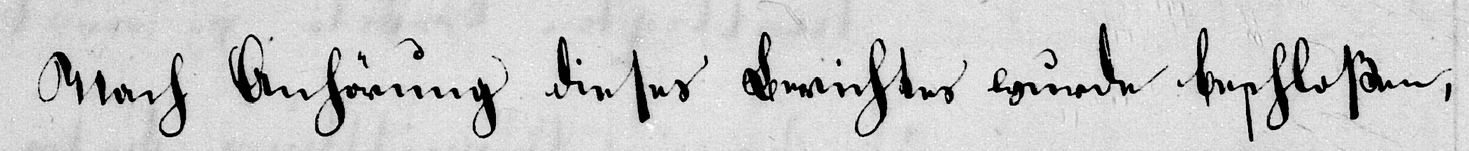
Nach Anhörung dieses Berichtes wurde beschloßen,
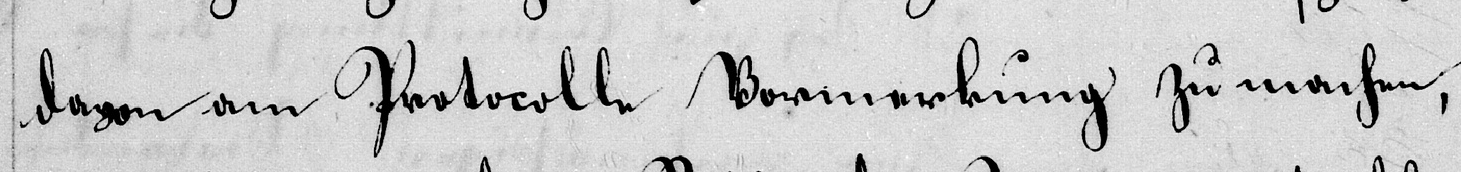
davon am Protocolle Vormerkung zu machen,
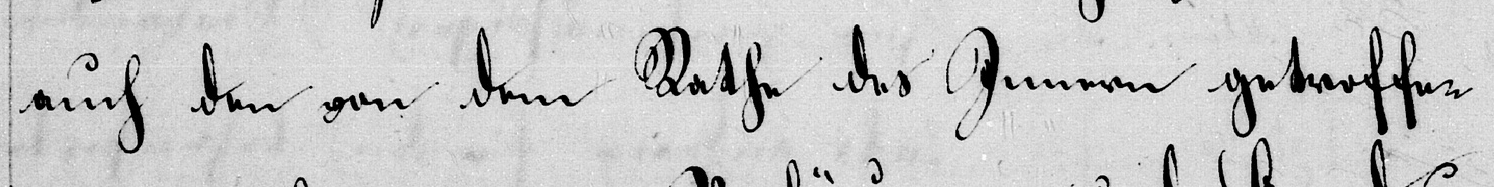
auch den von dem Rathe des Innern getroffe¬
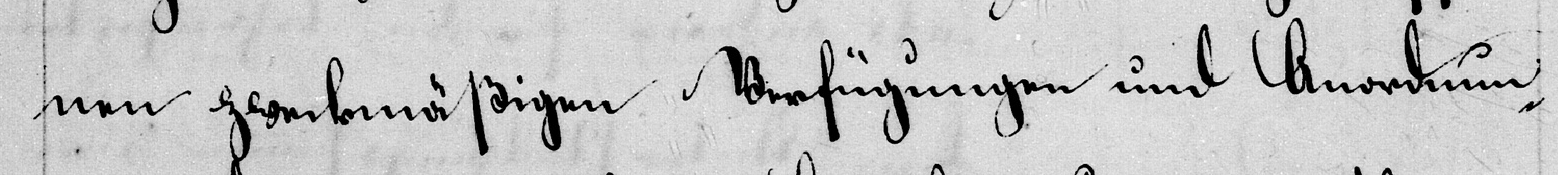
nen zweckmäßigen Verfügungen und Anordnun¬
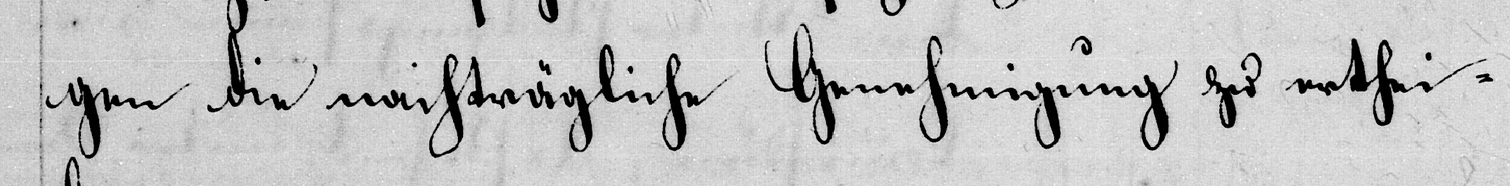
gen die nachträgliche Genehmigung zu erthei¬
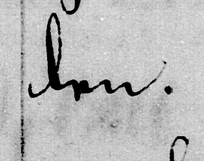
len.
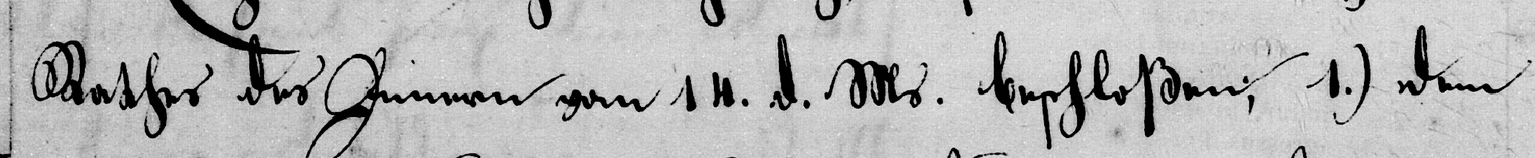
Rathes des Innern vom 14. d. Ms. beschloßen; 1.) dem
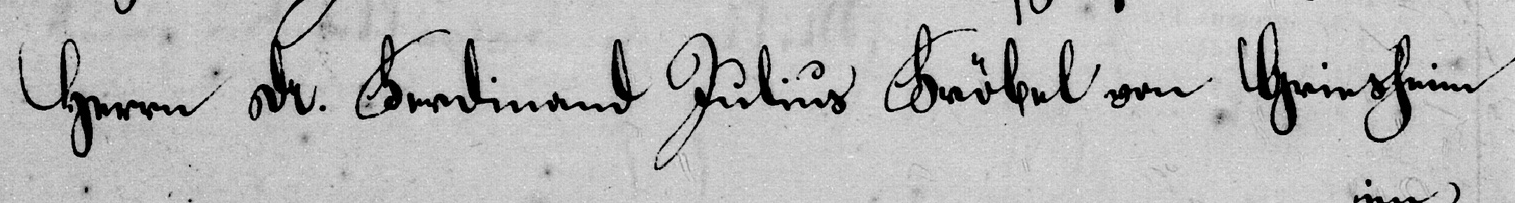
Herrn Dr. Ferdinand Julius Fröbel von Griesheim
